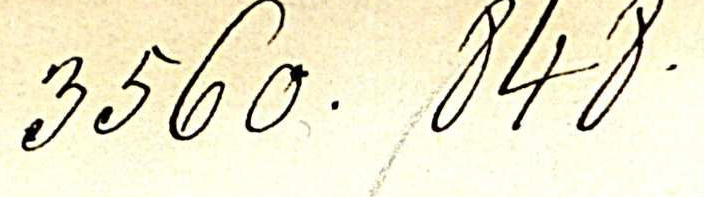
3560. 848.
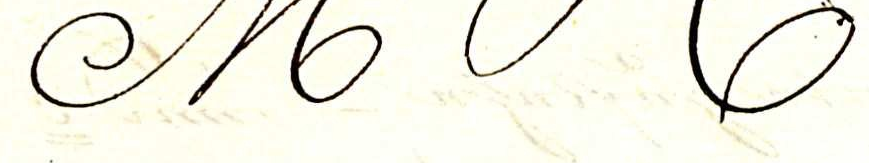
M R
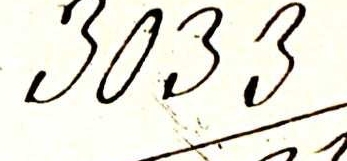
3033
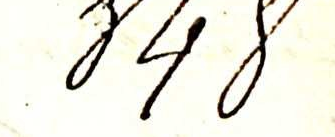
848
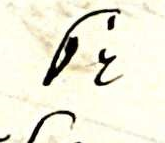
Sr.
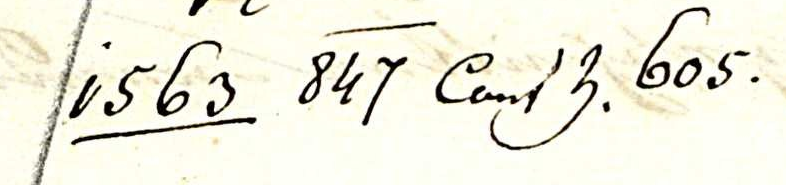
1563 847 Comt 3. 605.
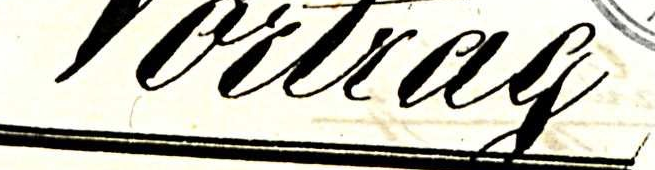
Vortrag
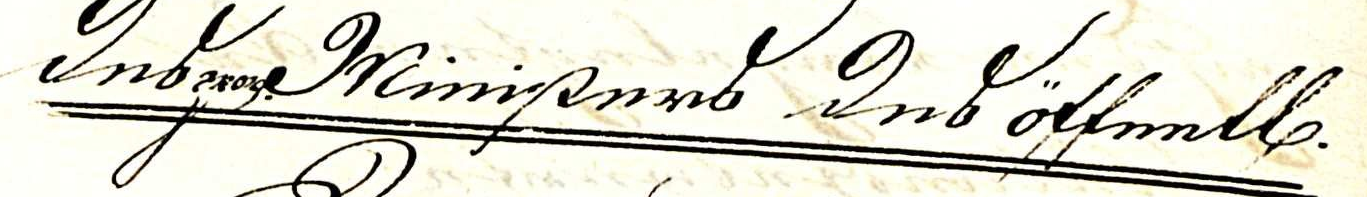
des xx Ministers des öffentl.
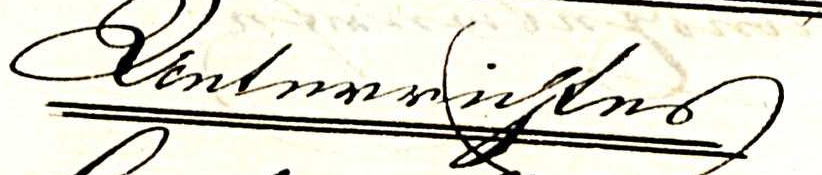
Unterrichtes
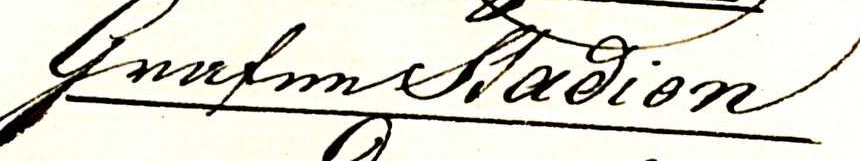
Grafen Stadion
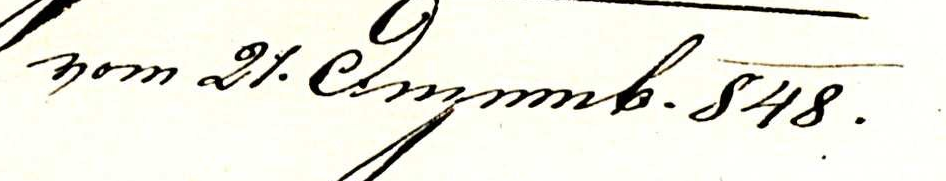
vom 21. Dezemb. 848
